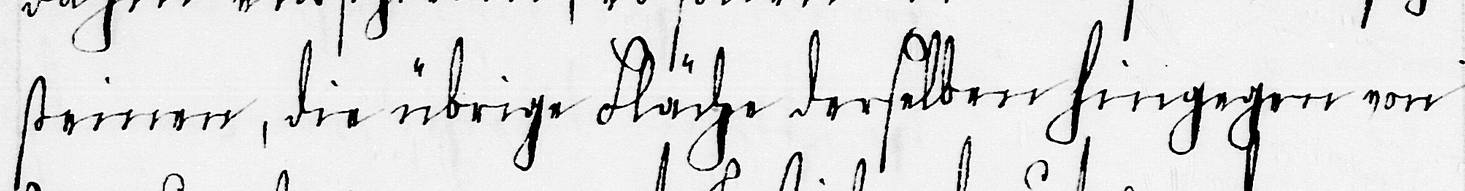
steinen, die übrige Fläche derselben hingegen von
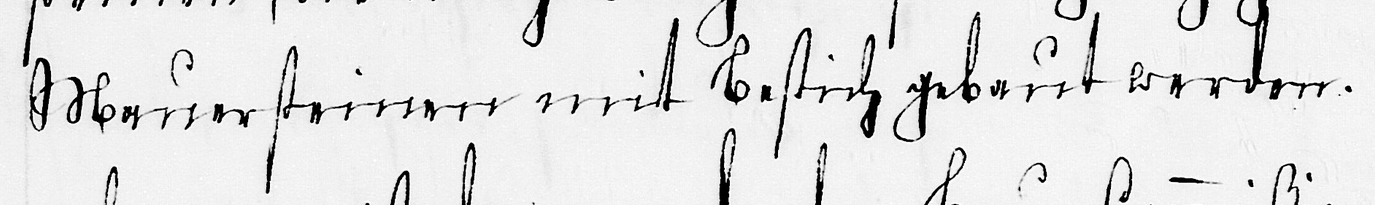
Mauersteinen mit Bestich gebaut werden.
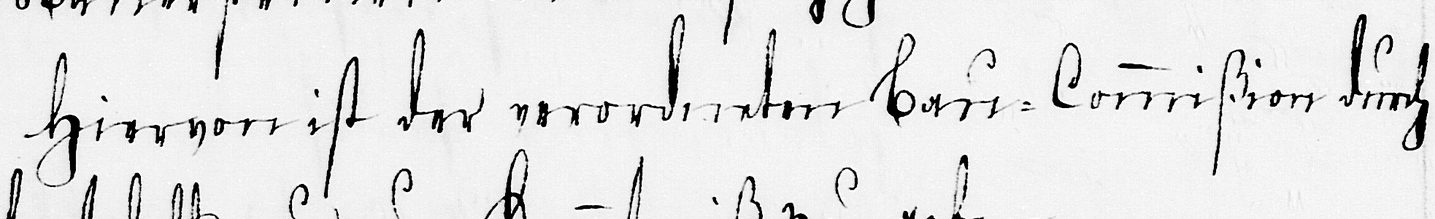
Hiervon ist der verordneten Bau-Commißion durch
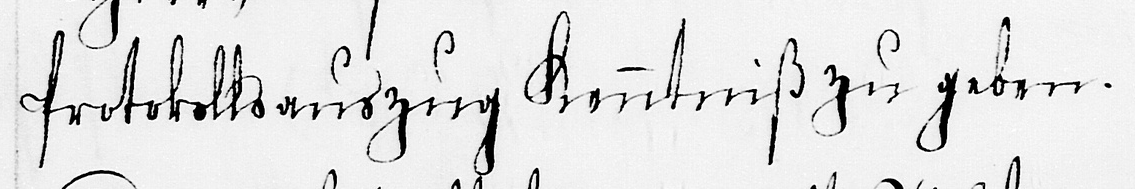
Protokollsauszug Kenntniß zu geben.
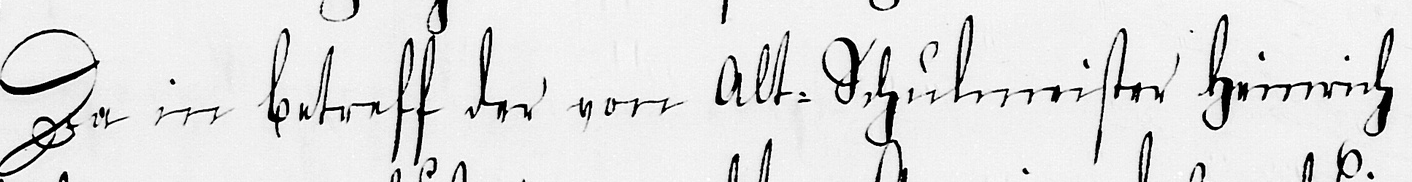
Da in Betreff der von Alt-Schulmeister Heinrich
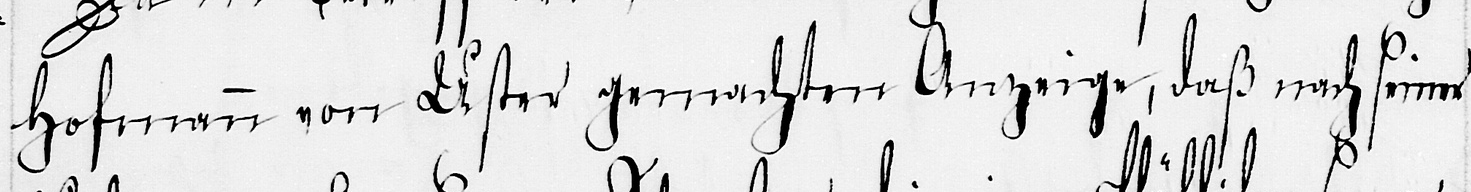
Hofmann von Uster gemachten Anzeige, daß nach seiner
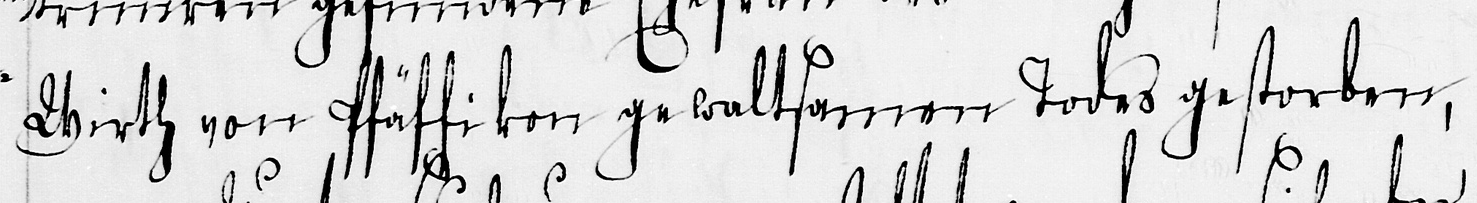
Wirth von Pfäffikon gewaltsamen Todes gestorben,
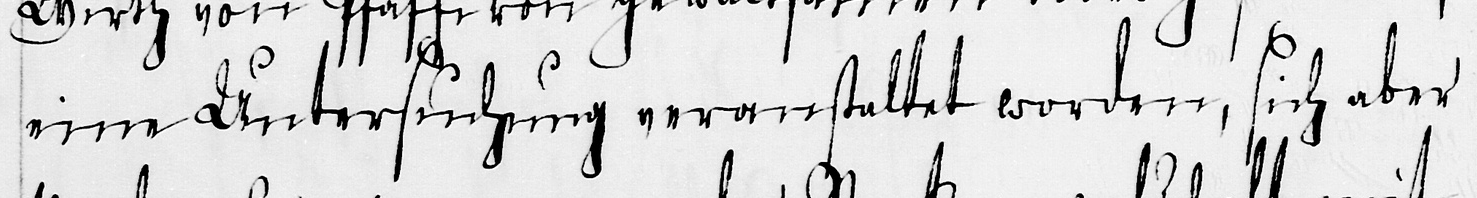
eine Untersuchung veranstaltet worden, sich aber
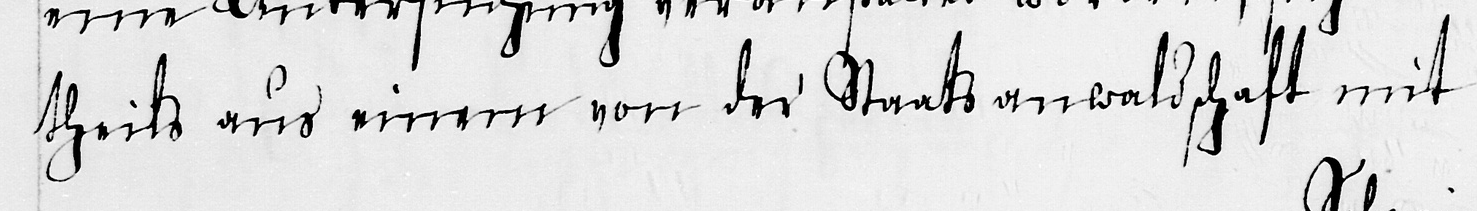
theils aus einem von der Staatsanwaldschaft mit
